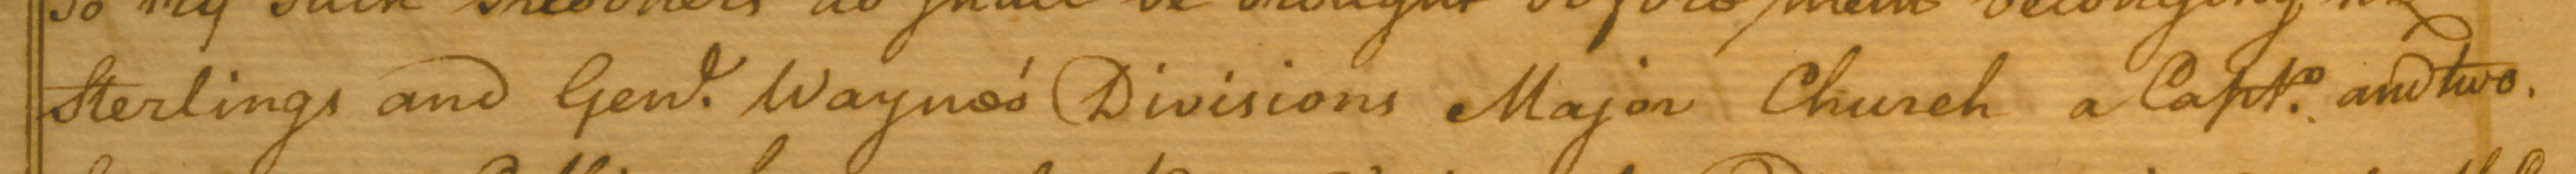Sterlings and Gen^l. Wayne's Divisions Major Church a Capt^n. and two
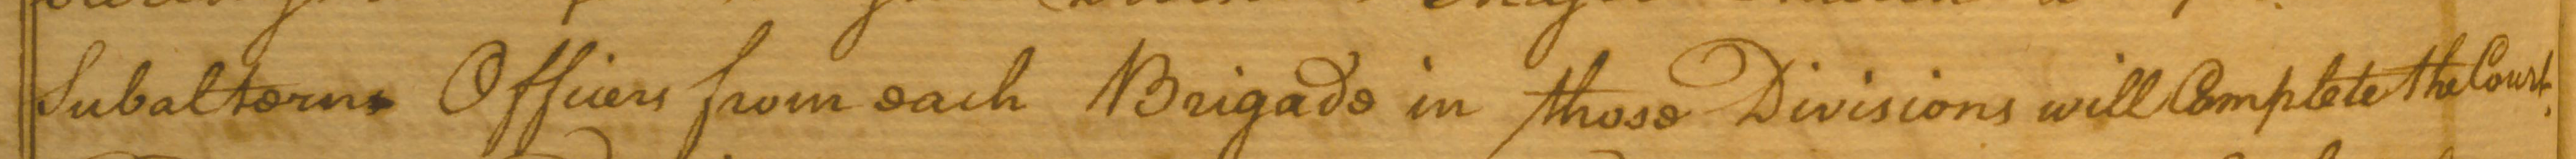Subaltern Officers from each Brigade in those Divisions will Complete the Court.
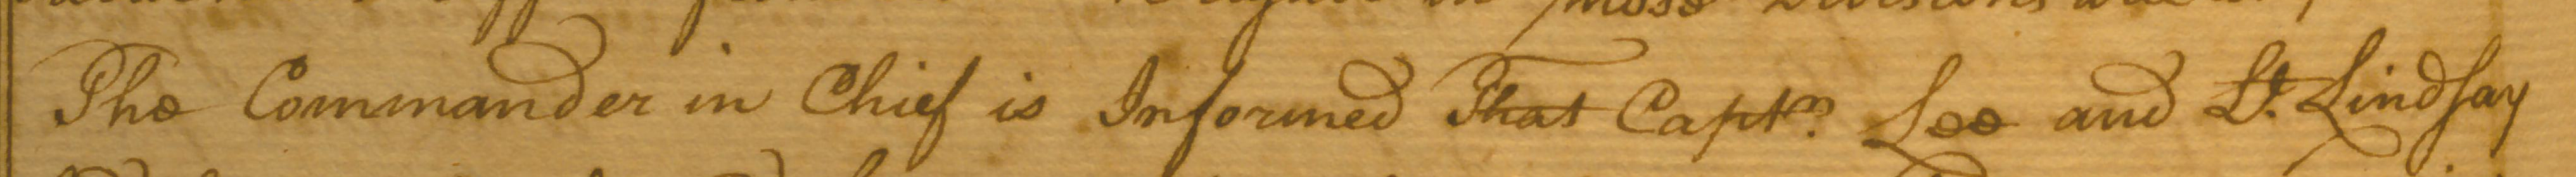The Commander in Chief is Informed that Capt^n. Lee and L^t. Lindsay
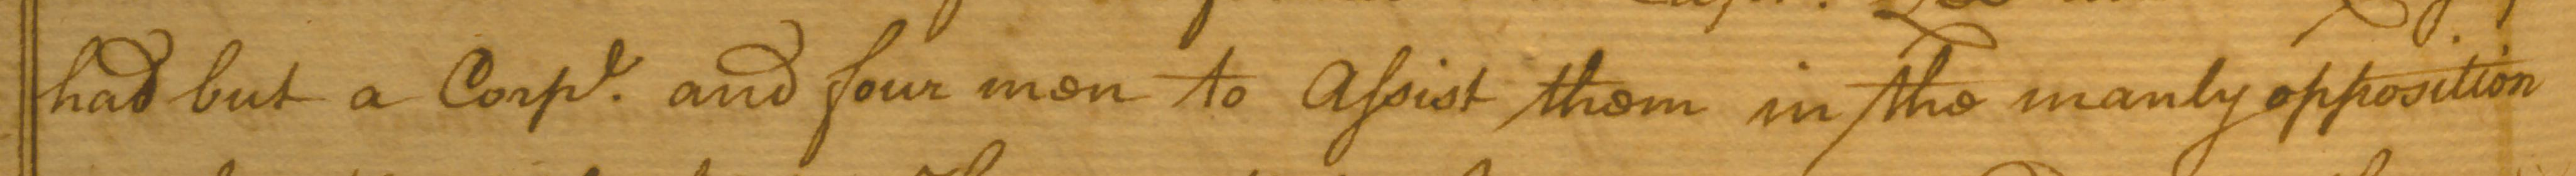had but a Corp^l. and four men to Assist them in the manly opposition
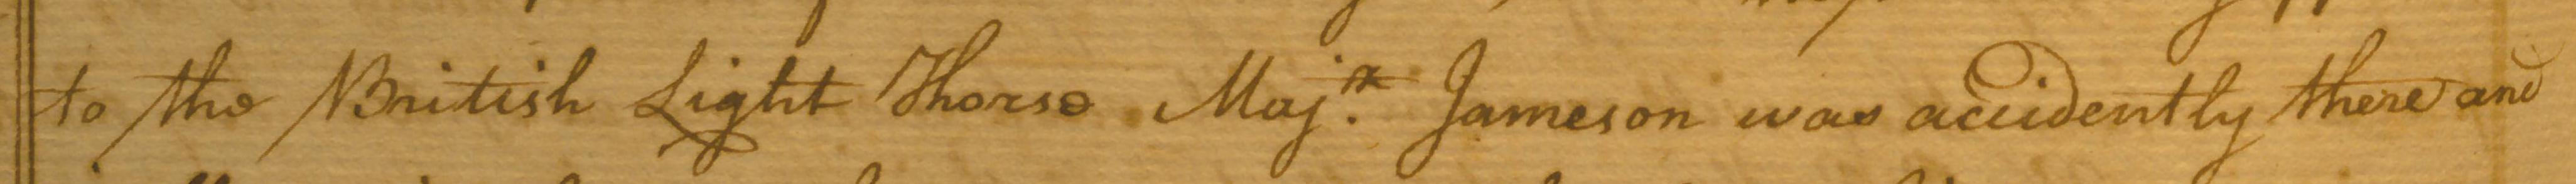to the British Light Horse Maj^r. Jameson was accidently there and
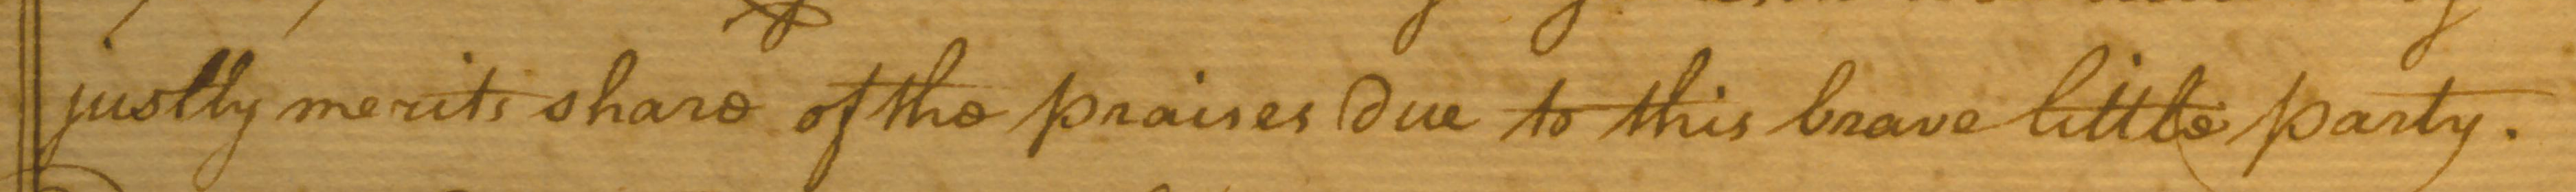justly merits share of the praises due to this brave little party.
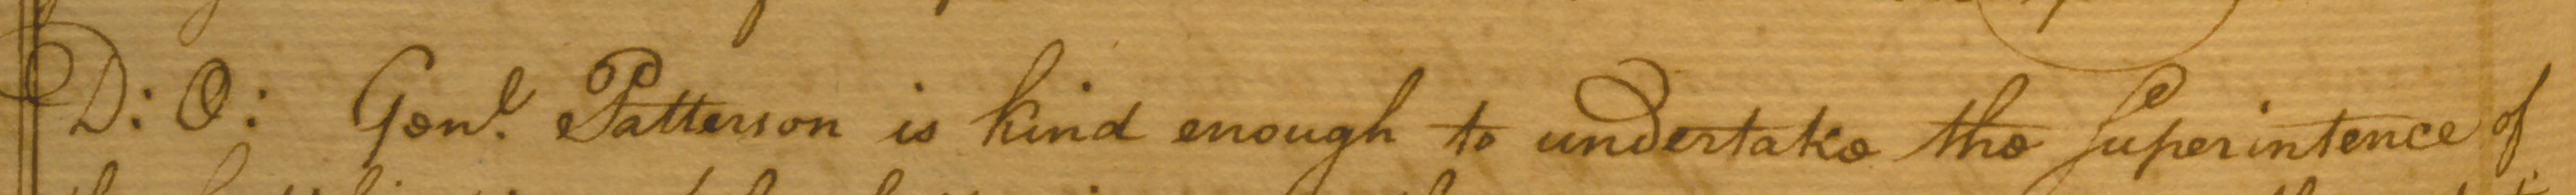D: O: Gen^l. Patterson is kind enough to undertake the Superintence of
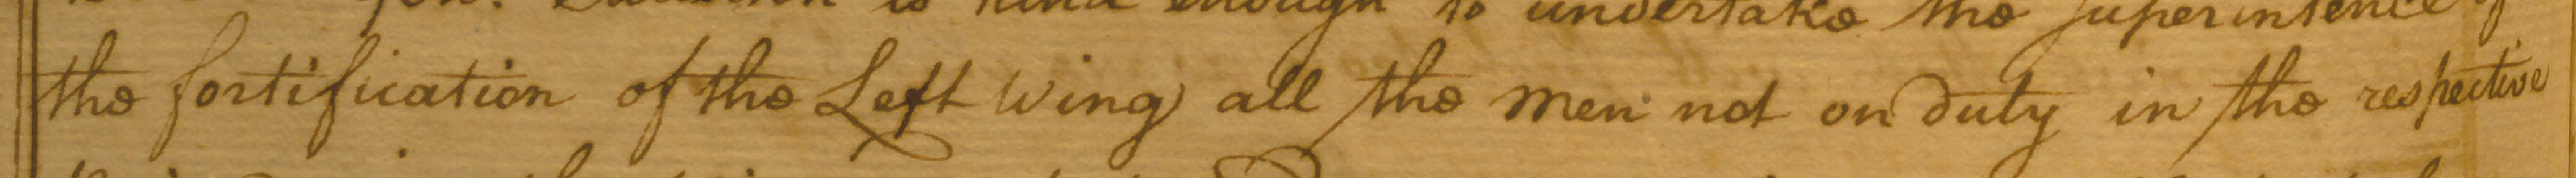the fortification of the Left Wing all the men not on duty in the respective
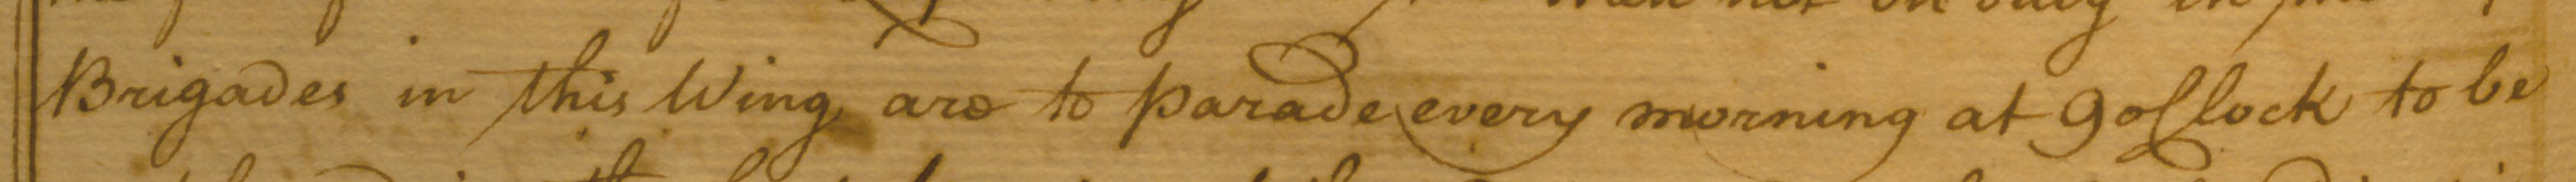Brigades in this Wing are to parade every morning at 9 oClock to be
